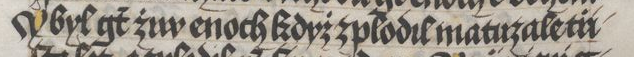Y byl ḡt żiw enoch kdyż zplodil matuzale tṙi¬
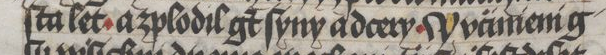ſta let.a zplodil ḡt ſyny a dcery.Y vċíníení g¬
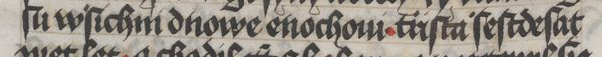ſu wẛichni dnowe enochoui. tṙi ſta ẛeſtdeſat
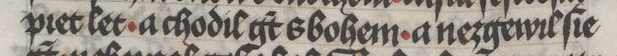piet let.a chodíl ḡt s bohem.a nezgewil ſie
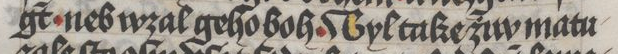ḡt.neb wzal geho boh. Byl take żiw matu¬
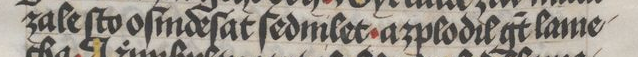zale ſto oſmdeſat ſedmlet.a zplodil ḡt lame¬
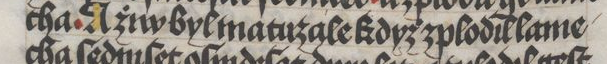cha.A żiw byl matuzale kdyż zplodil lame¬
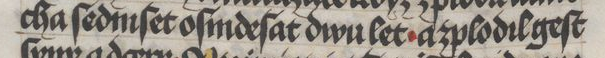cha ſedmſet oſmdeſat dwu let.a zplodil geſt
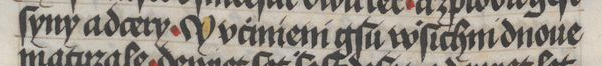ſyny a dcery.Y vċiníení gſu wẛichni dnouie
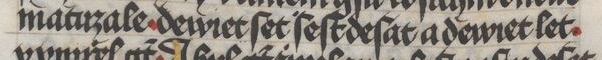matuzale.dewiet ſet ẛeſtdeſat a dewiet let.
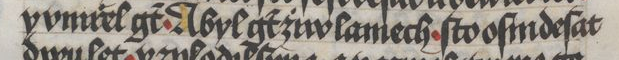y vmřel ḡt. A byl ḡt żiw lamech.ſto oſmdeſat
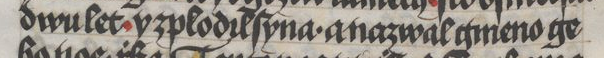dwu let.y zplodil ſyna.a nazwal gmeno ge¬
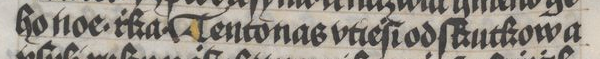ho noe. ṙka.Tento nas vtieẛí od ſkutkow a
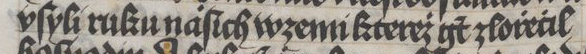vſylí ruku naẛich w zemí ktereż ḡt zloṙeċil
